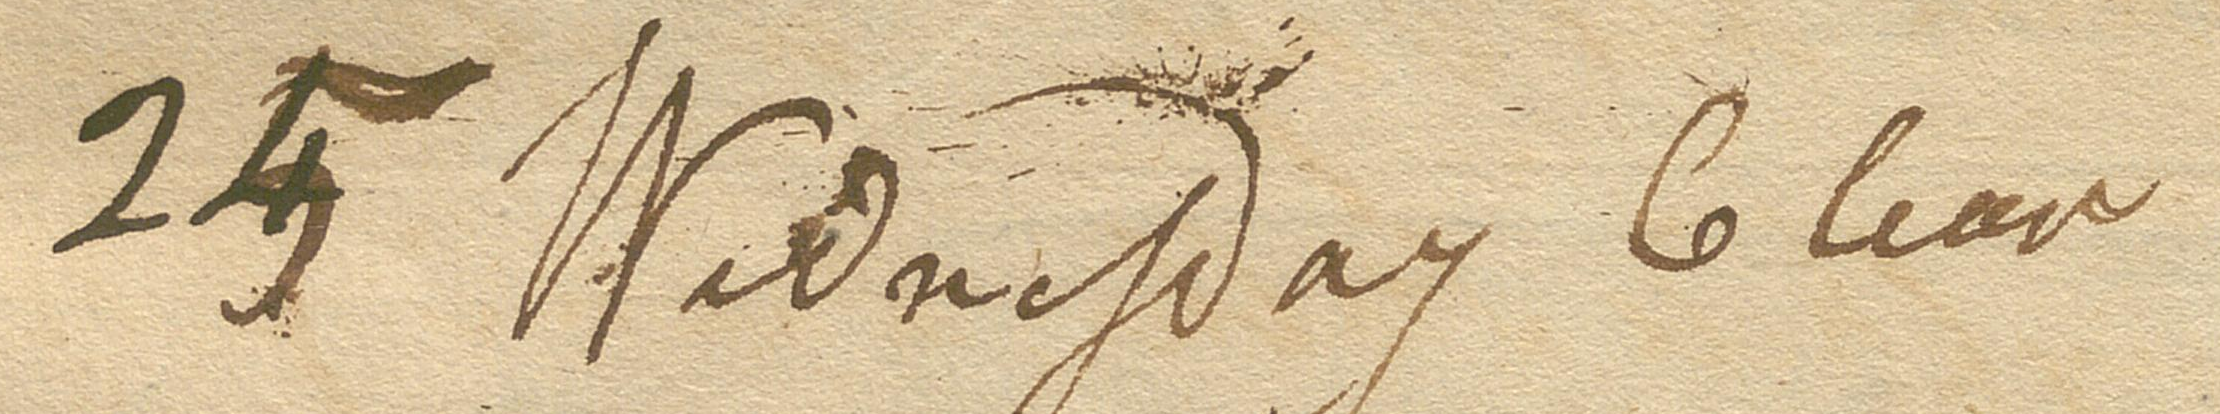24 Wednesday Clear
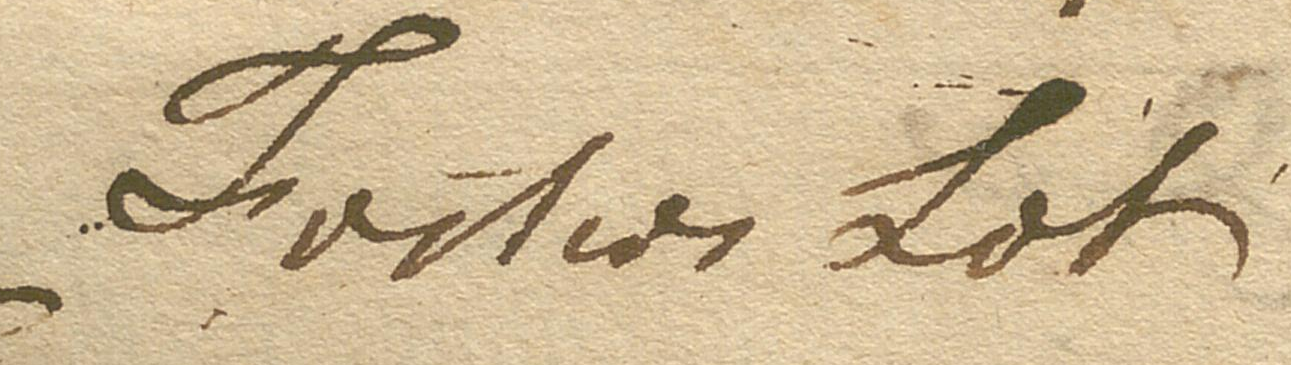Foiters Lot
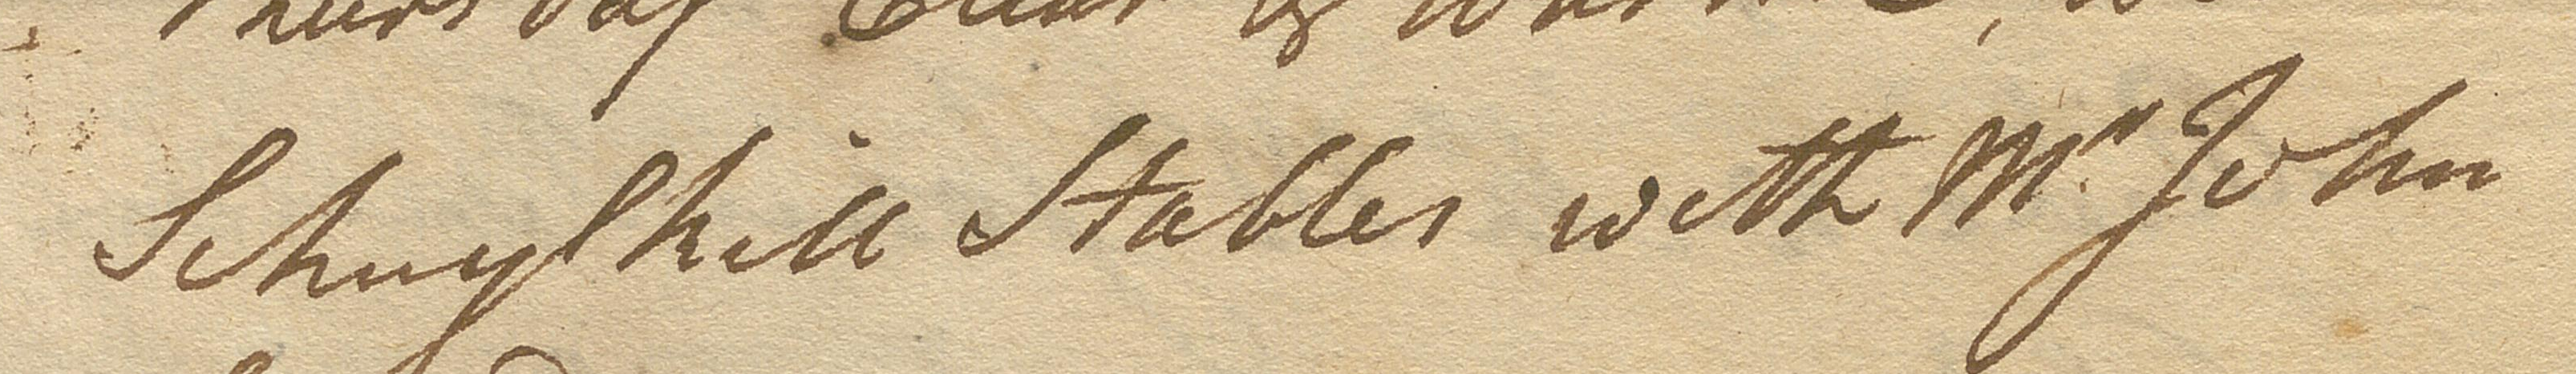Schuylkill Stables with M^r. John
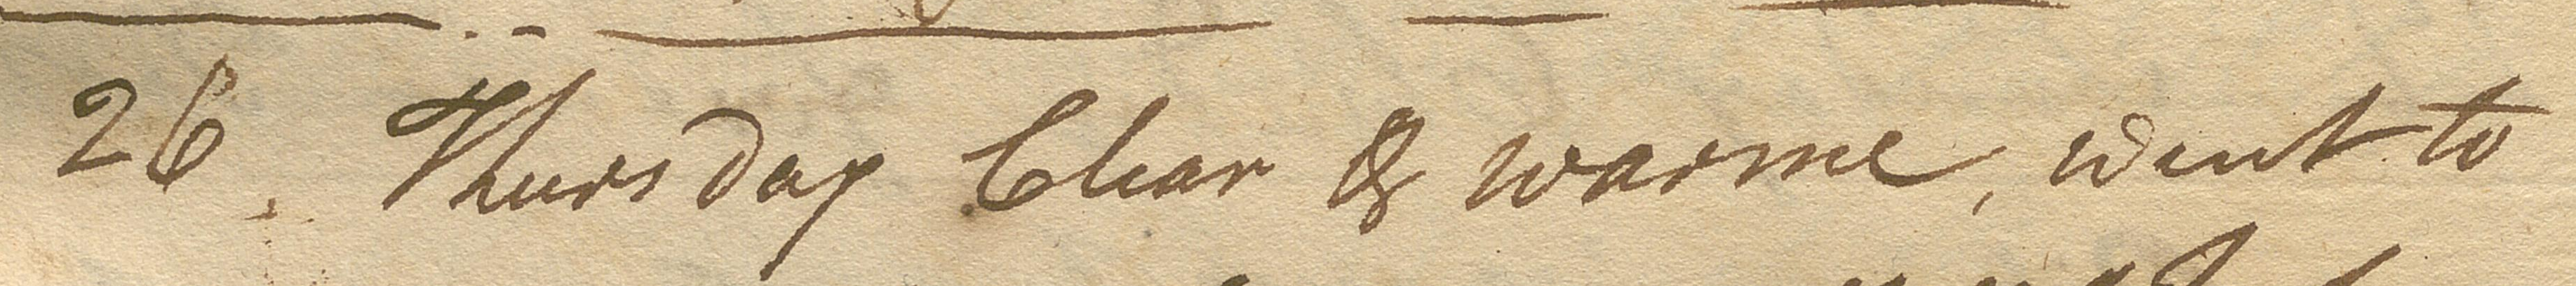26 Thursday Clear & warme went to
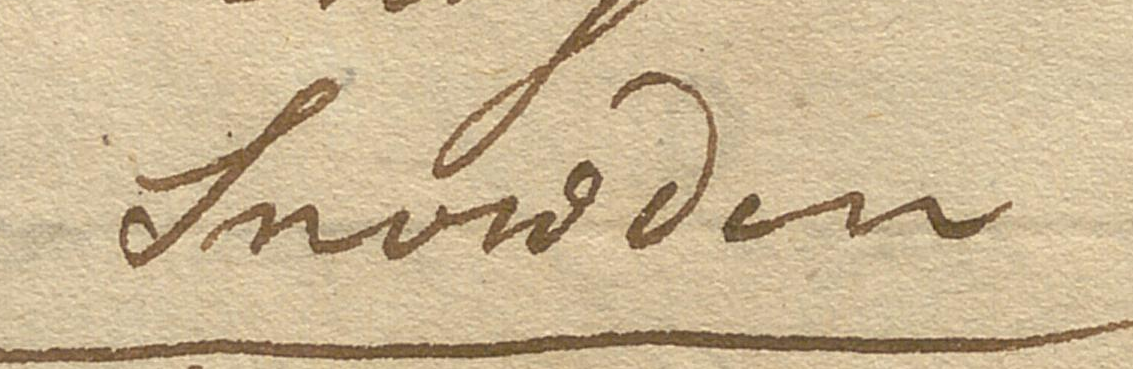Snowden
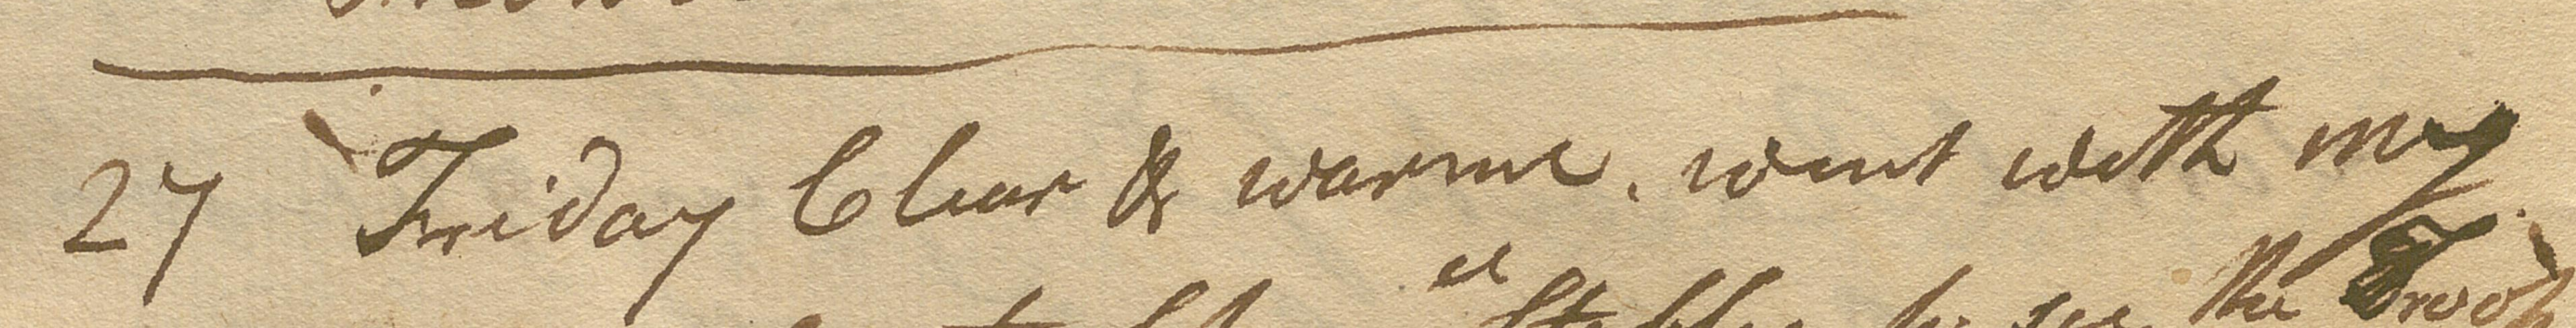27 Friday Clear & warme. went with my
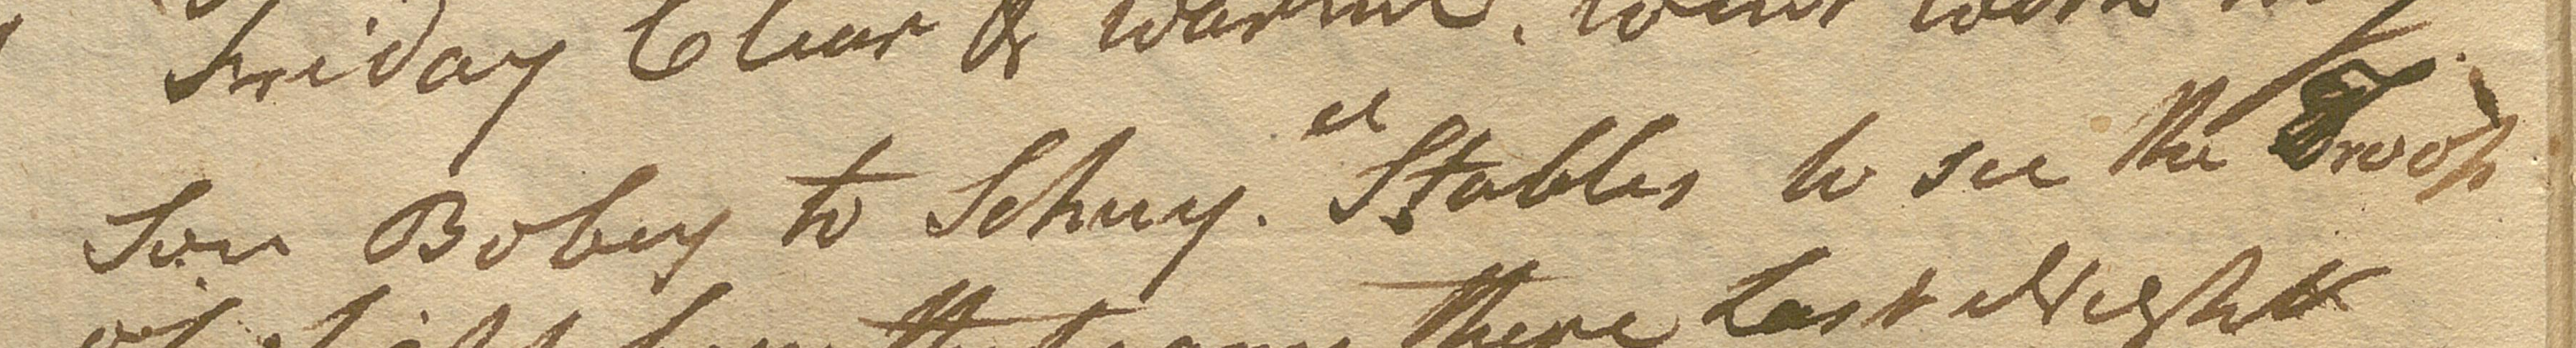son Bobey to Schuy^ll. Stables to see the Troop
